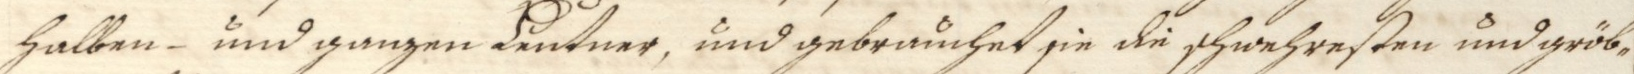halben- und ganzen Centner, und gebrauchet sie die schwehresten und gröb-
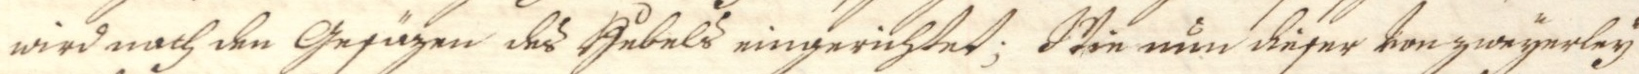wird nach den Gesäzen des Hebels eingerichtet; Wie nun dieser von zweyerley
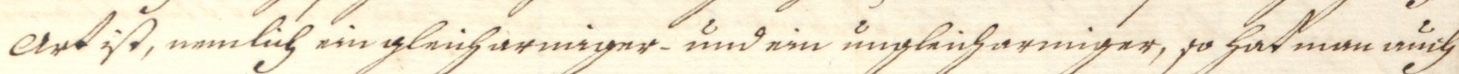Art ist, nemlich ein gleicharmiger- und ein ungleicharmiger, so hat man auch
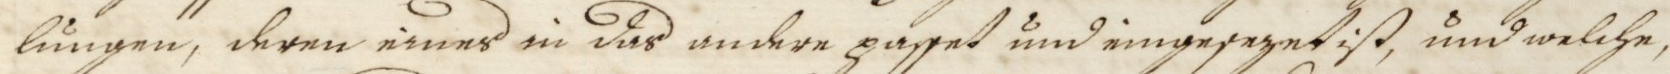lungen, deren eines in das andere passet und eingesezet ist, und welche,
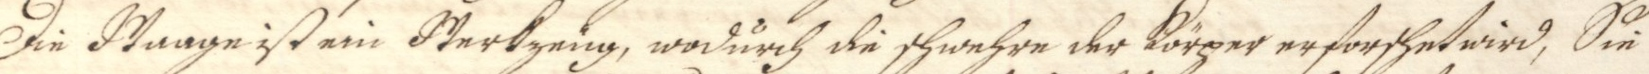Die Waage ist ein Werkzeüg, wodurch die schwehre der Körper erforschet wird, Sie
